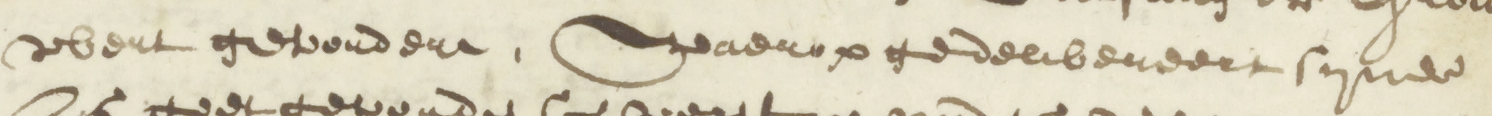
wert gevordert. Waerop gedelibereert sijnde
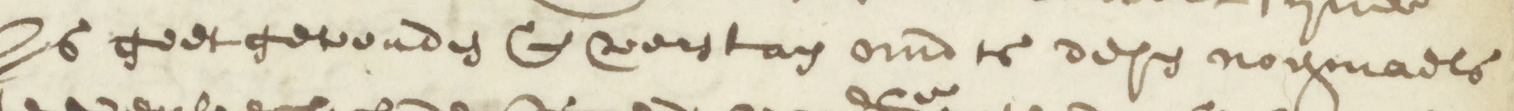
Is goetgevonden & verstaen midts desen nochmaels
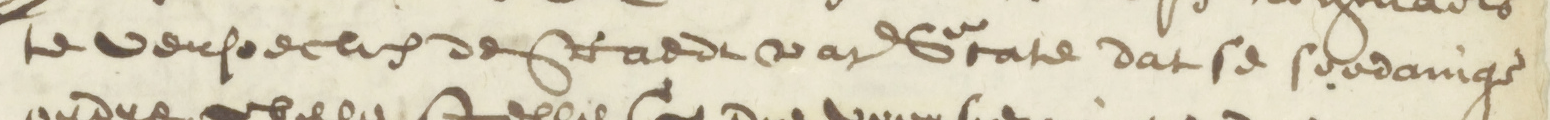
te versoecken de Raedt van State dat se soodanige
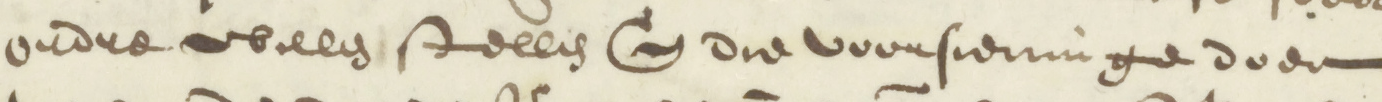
ordre willen stellen & die voorsieninge doen
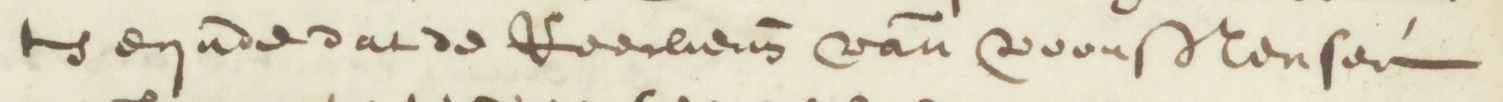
ten eynde dat de Reeckenin van voorsz Rensen
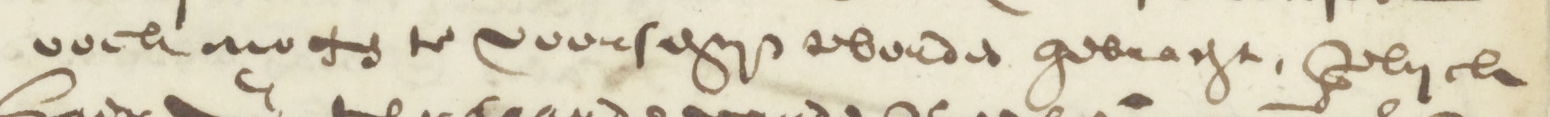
oock mogen te voorschijn worden gebracht, gelijck
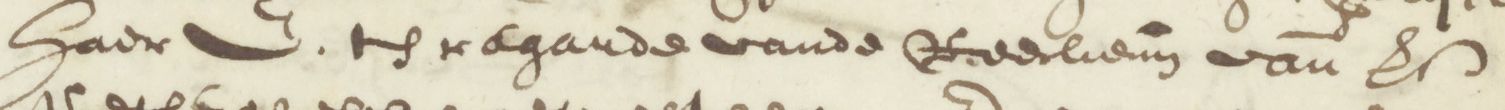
Haer E. ter regarde vande Reecken van vs
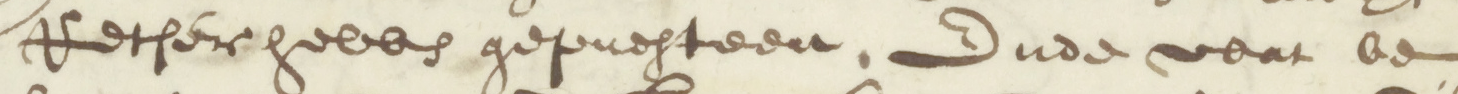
Retser hebben gepresteert. Ende wat be„
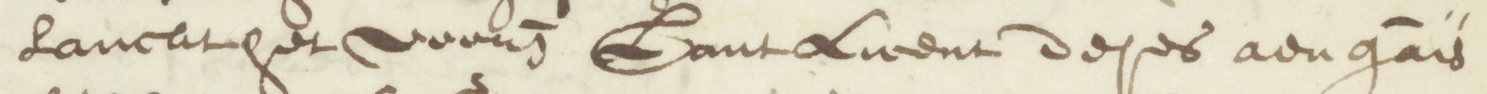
lanckt het voorn Lant Licent deses aengae
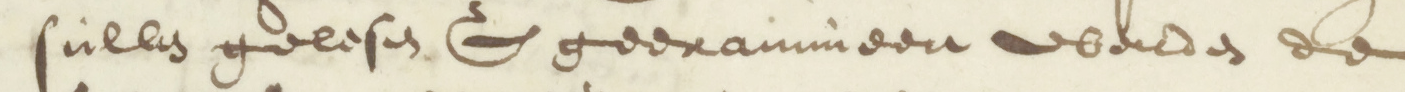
sullen gelesen & geexamineert werden de
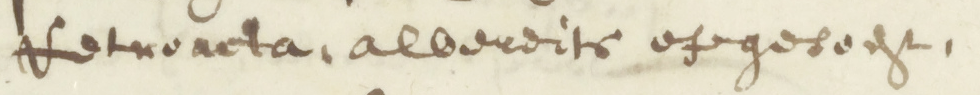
Retroacta, albereits opgesocht.
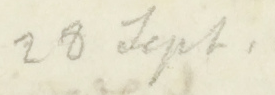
28 sept .
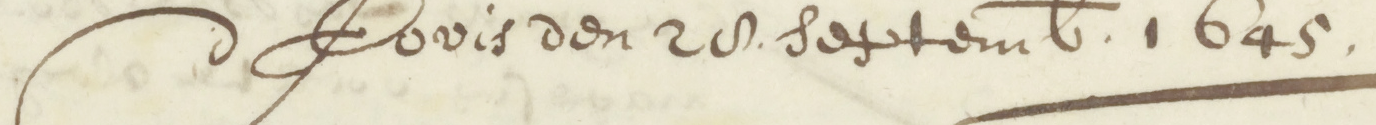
Jovis den 28. Septemb. 1645
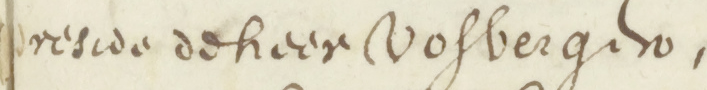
Preside de heer Vosbergen,
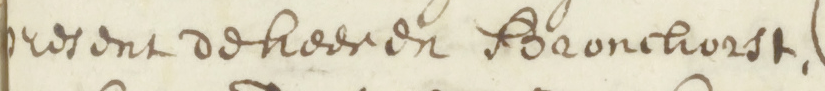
present de heeren Bronchorst,
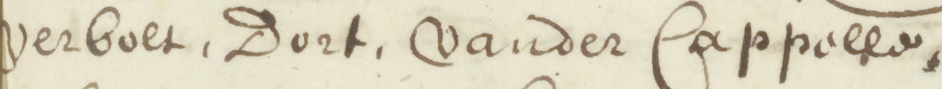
Verbolt, Dort, vander Cappelle,
